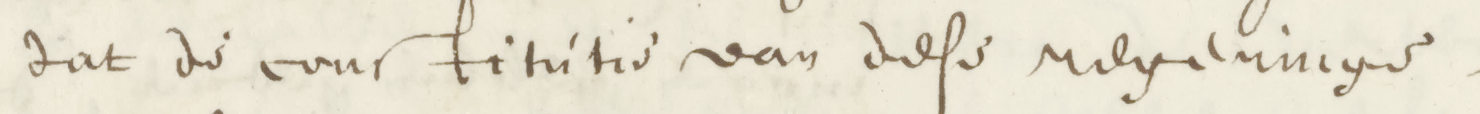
dat de constitutie van dese regeringe
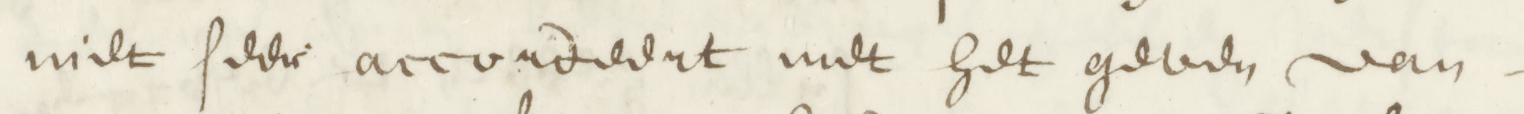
niet seer accordeert met het geven van
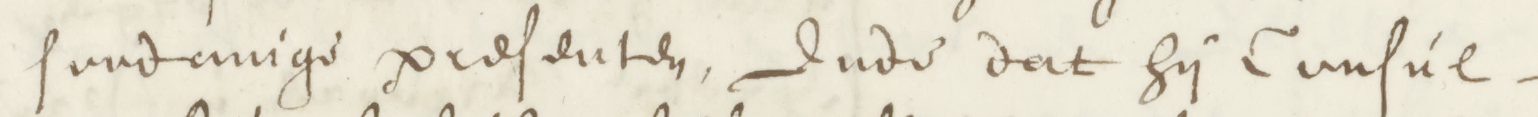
soodanige presenten, Ende dat hij Consul
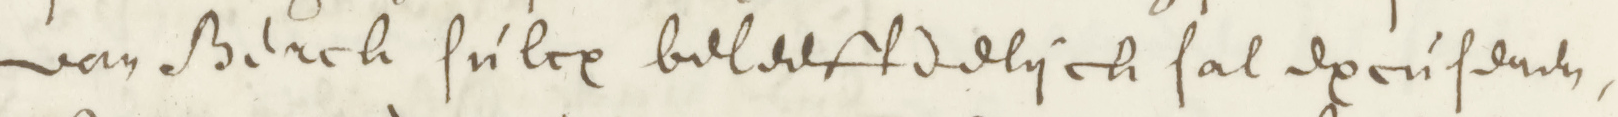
van Berck sulcx beleeffdelijck sal excuseren
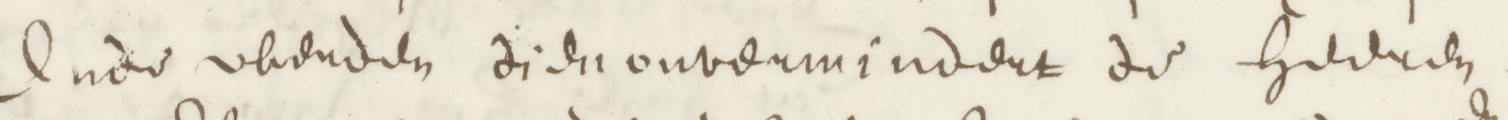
ende werden dien onvermindert de heeren
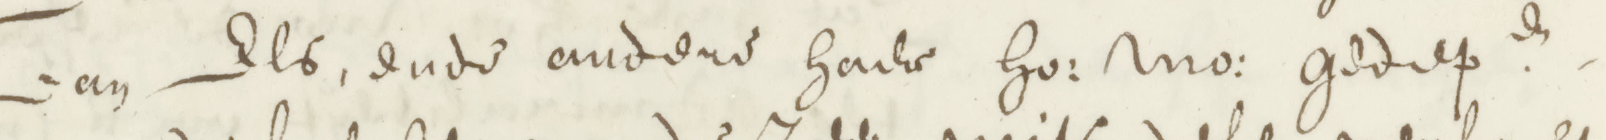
van Els, ende andere haer ho:mo: gedepen.
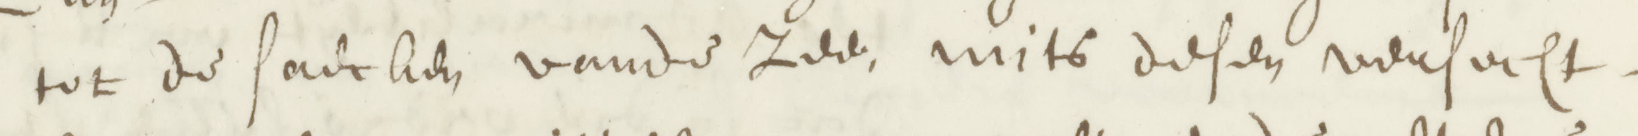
tot de saecken vande zee, mits desen versocht
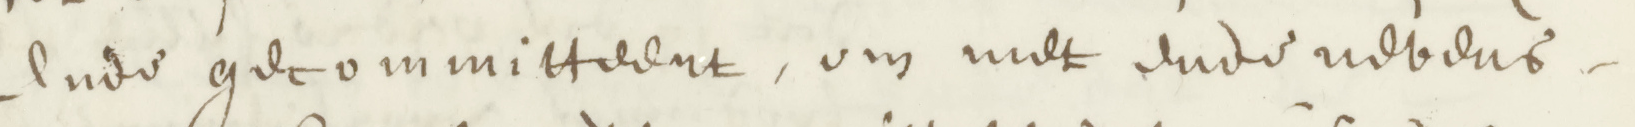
ende gecommitteert, om met ende nevens
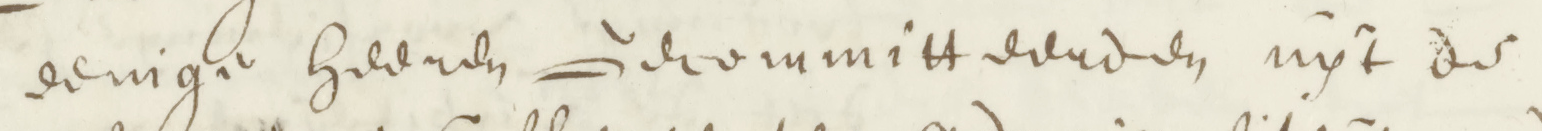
eenige heeren Gecommitteerden uijt de
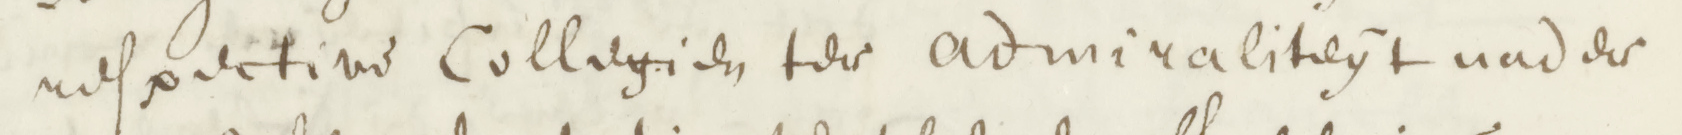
respective Collegien ter admiraliteijt nader
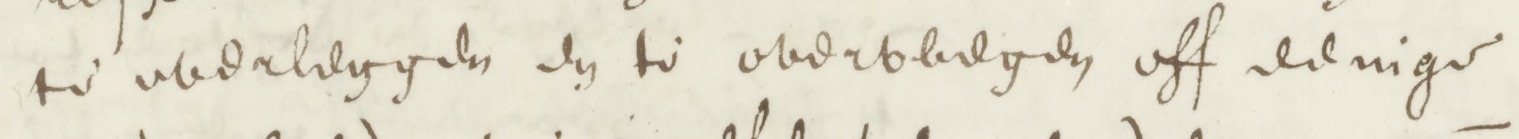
te overleggen en te overwegen off eenige
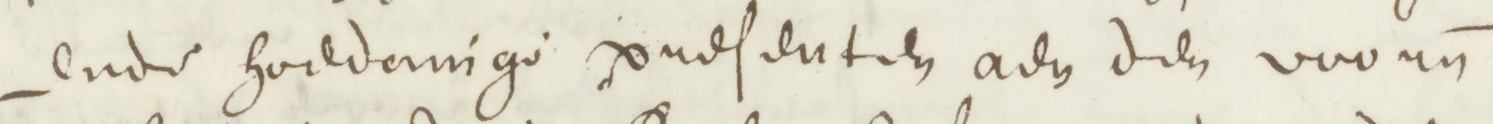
ende hoedanige presenten aen den voorn
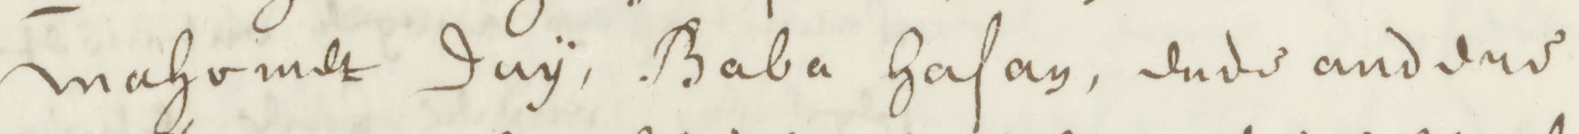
Mahomet Daij Baba Hasan, ende andere
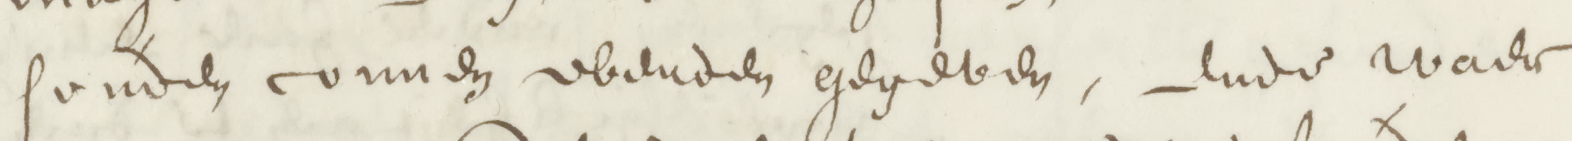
souden connen werden gegeven, ende waer
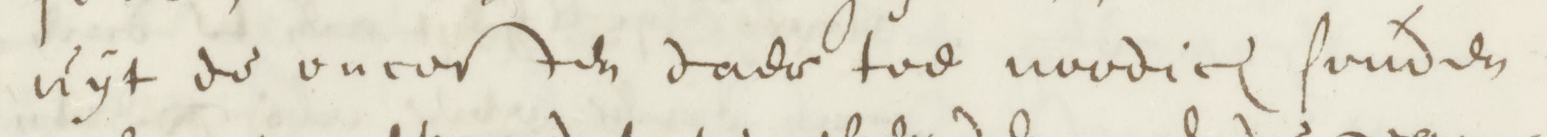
uijt de oncosten daer toe noodich souden
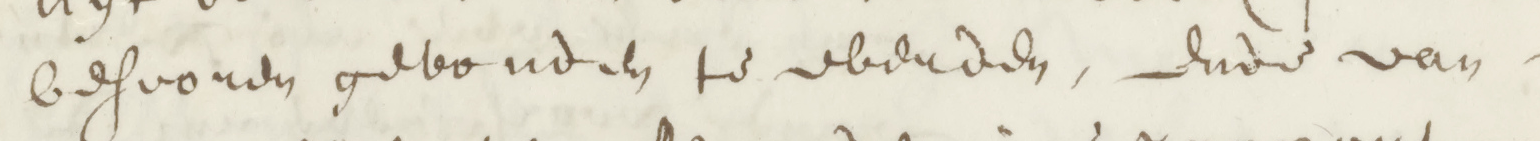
behooren gevonden te werden, ende van
